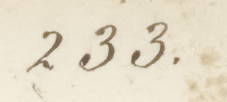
233.
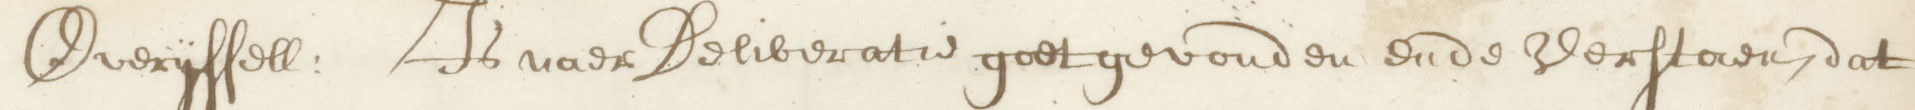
Overijssell: Is naer Deliberatie goetgevonden ende verstaen, dat
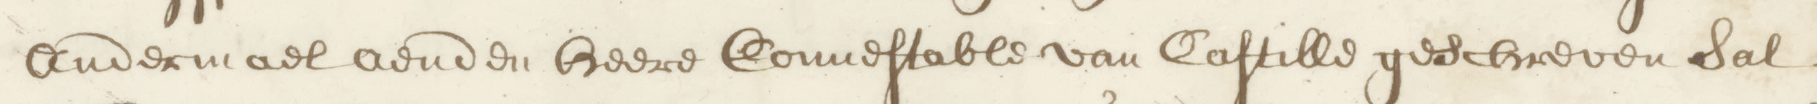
andermael aenden Heere Connestable van Castille geschreven Sal —
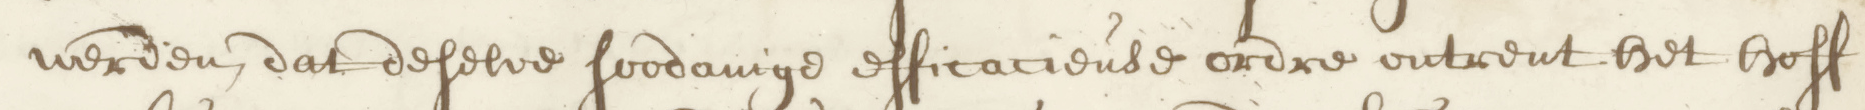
werden, dat deselve soodanige efficacieuse ordre ontrent het hoff
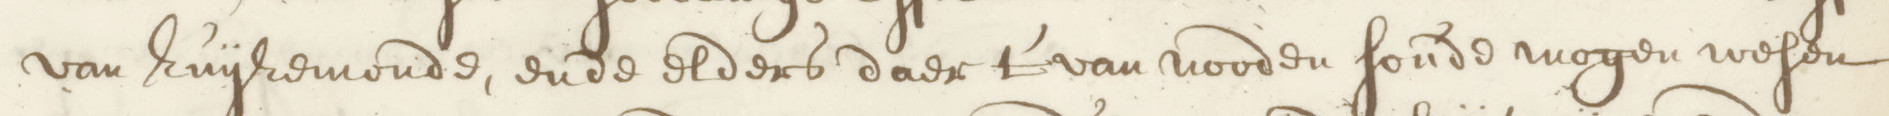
van Ruijremonde, ende elders daer t' van nooden soude mogen wesen
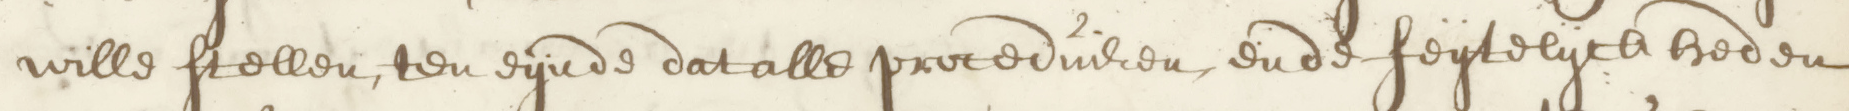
wille stellen, ten eijnde dat alle proceduiren, ende feijtelijck heden
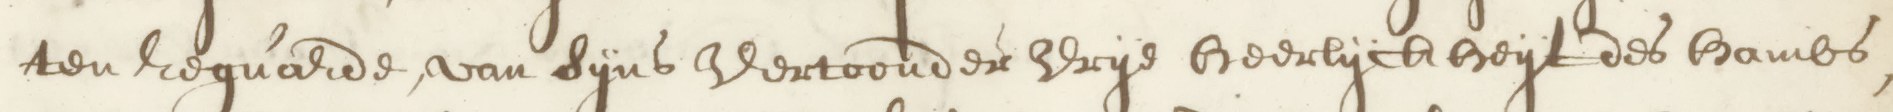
ten reguarde, van Sijns Vertoonder vrije heerlijckheijt des Hambs
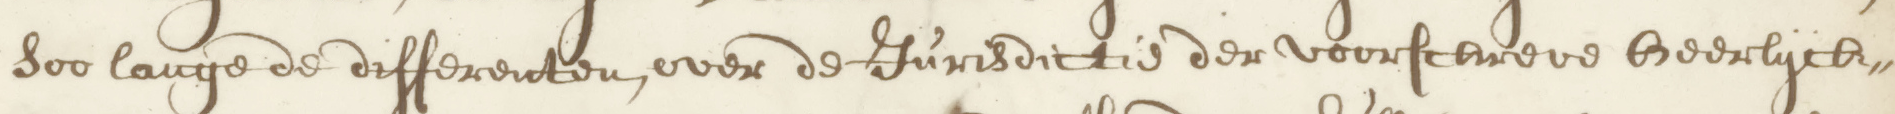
soo lange de differenten, over de Jurisdictie der voorschreve heerlijck,,
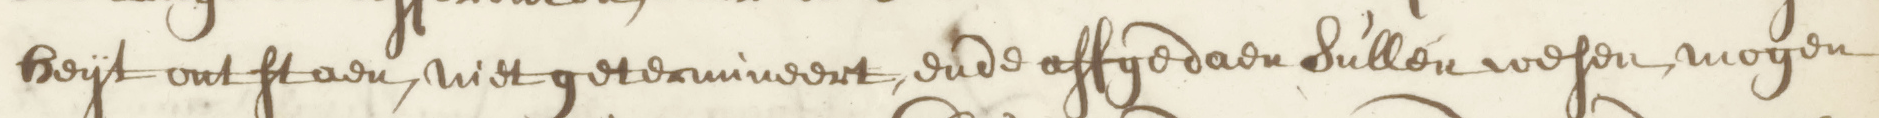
heijt ontstaen, niet getermineert, ende affgedaen Sullen wesen, mogen
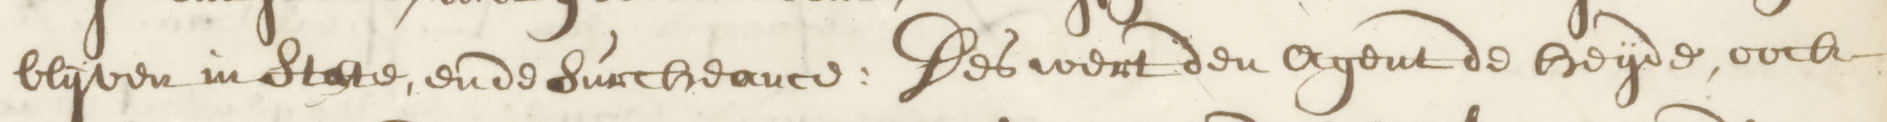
blijven in State, ende Surcheance: Des wert den agent de heijde, oock
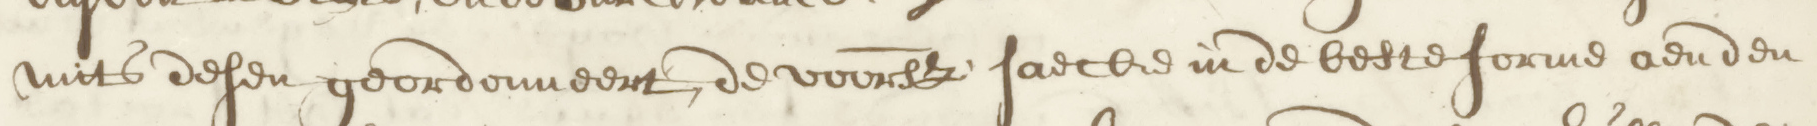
mits desen geordonneert, de voorsr. saecke in de beste forme aenden
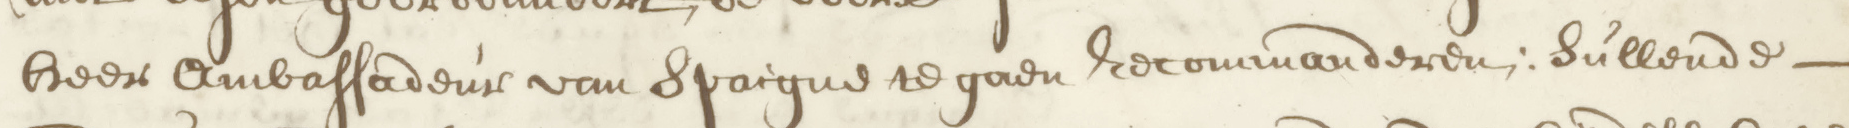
heer Ambassadeur van Spaigne te gaen recommanderen: Sullende —
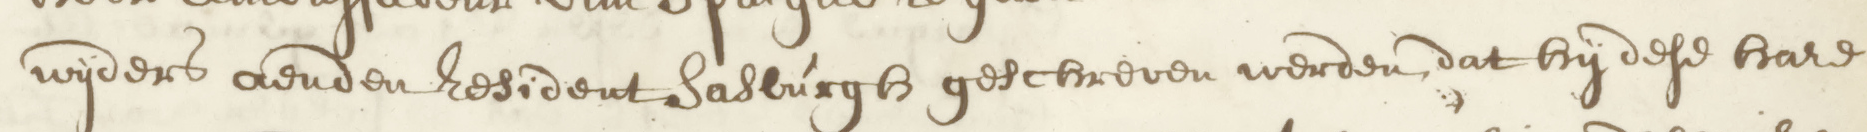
wijders aenden resident Sasburgh geschreven werden, dat hij dese hare
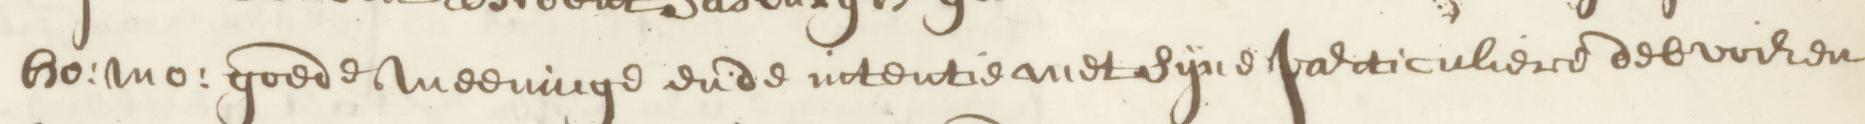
Ho:Mo: goede meeninge ende intentie met sijne particuliere debvoiren
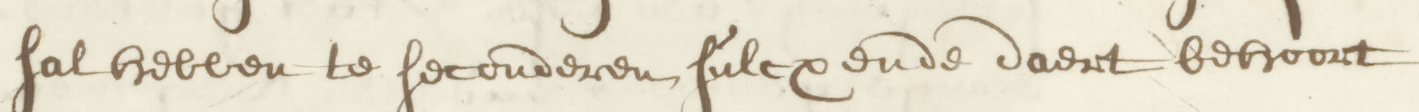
sal hebben te seconderen, sulcx ende daert behoort.
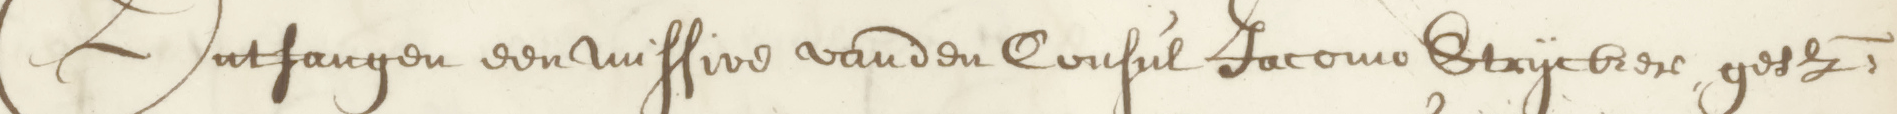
Ontfangen een missive vanden Consul Jacomo Strijcker, gesr.
